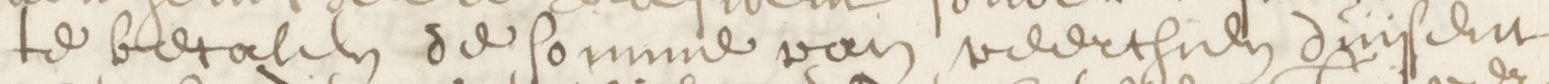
te betalen de somme van veerthien duijsent
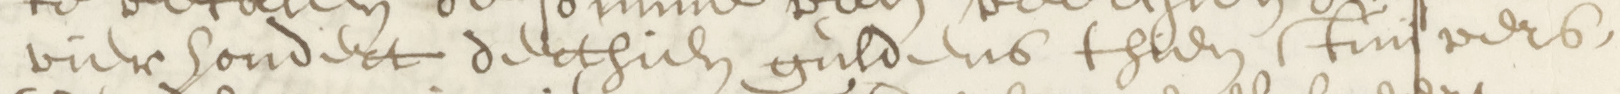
vier hondert derthien guldens thien stuijvers,
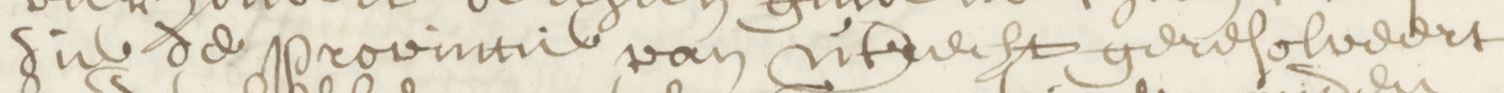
die de provintie van Utrecht geresolveert
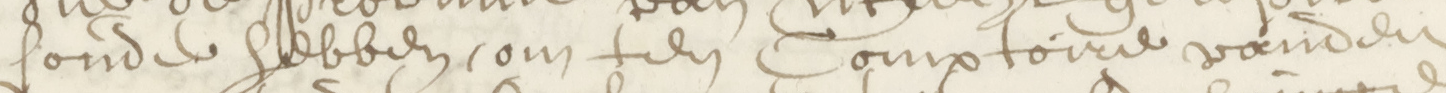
soude hebben, om ten Comptoire vanden
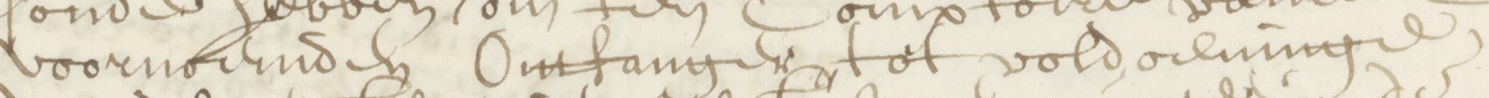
voornoemden Ontfanger, tot voldoeninge
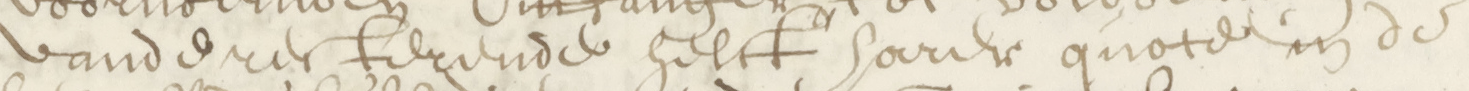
vande resterende helft harer quote in de
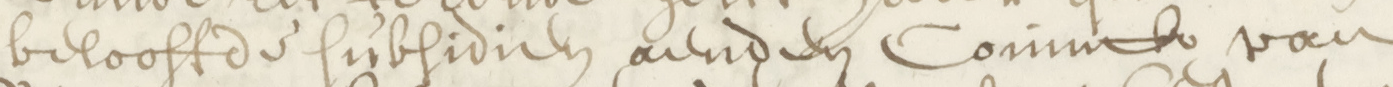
belooffde subsidien aenden Coninck van
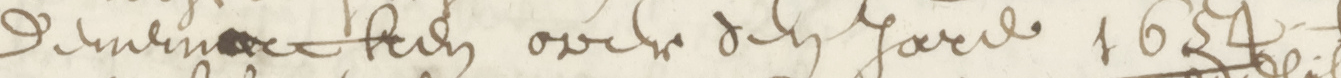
Denemarcken over den Jare 1654 te
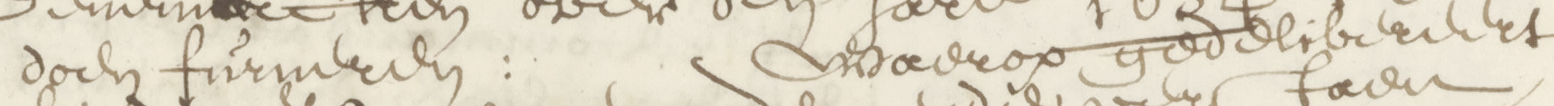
doen furneren: Waerop gedelibereert
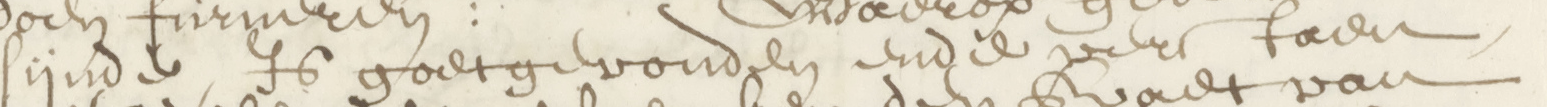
sijnde, Is goetgevonden ende verstaen,
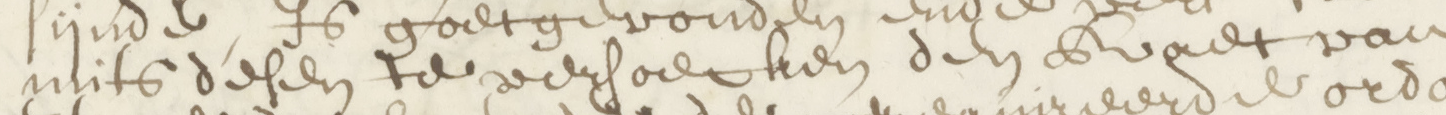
mits desen te versoecken den Raet van
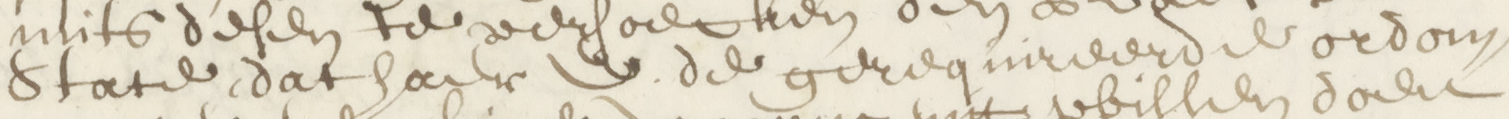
State, dat haer E. de gerequireerde ordon,,
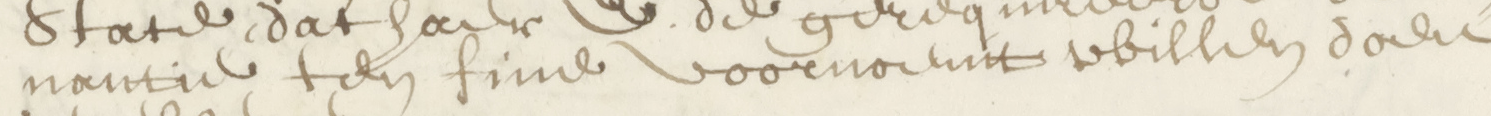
nantie ten fine voornoemt willen doen
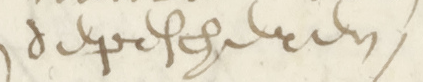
depescheren.
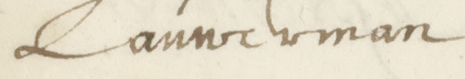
Lauwerman
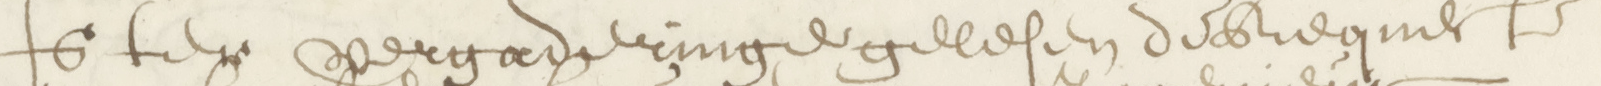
Is ter vergaderinge gelesen de Requeste
